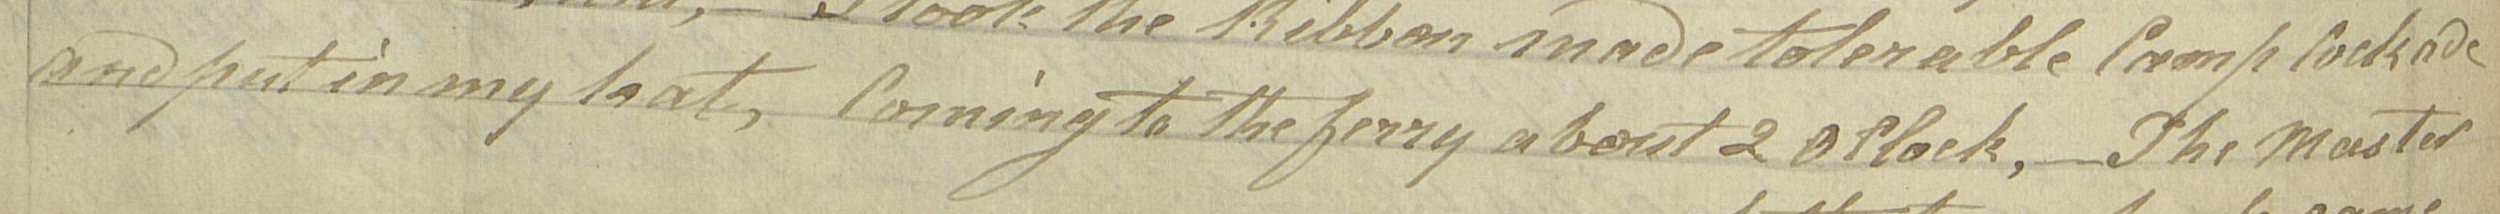and put in my hat, Coming to the ferry about 2 OClock, The Master
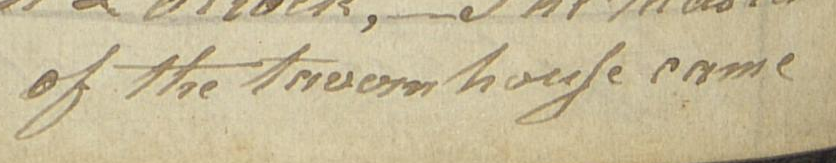of the tavern house came
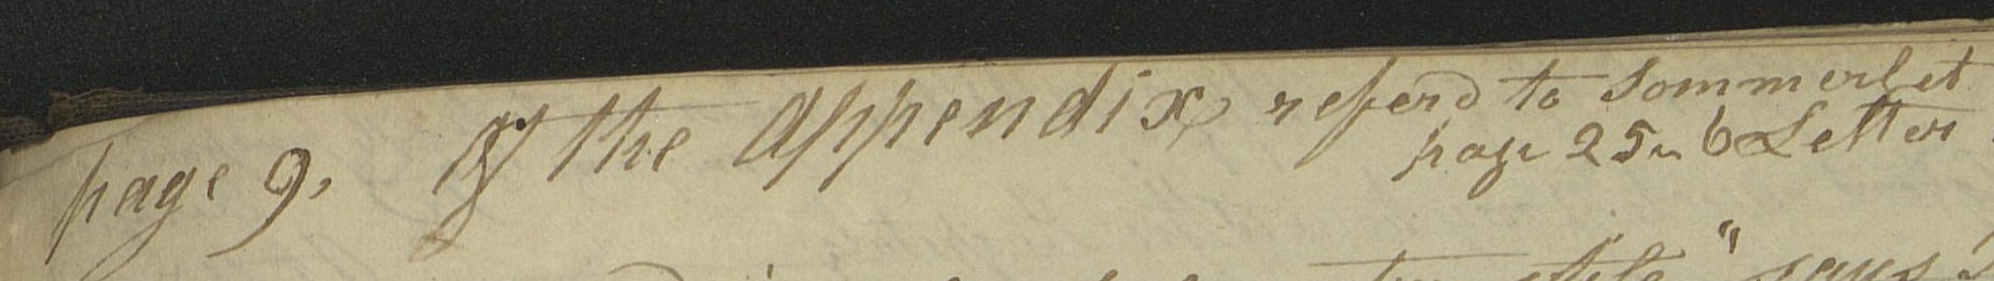page 9, Of the Appendix referd to Sommerset
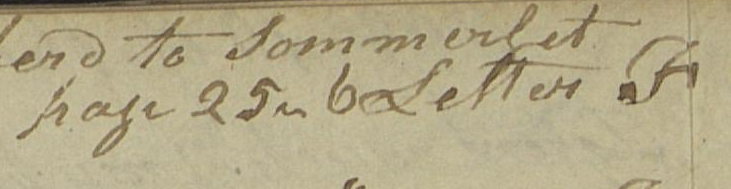page 25 - 6 Letter F
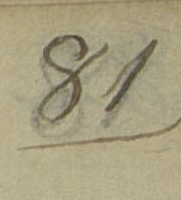81
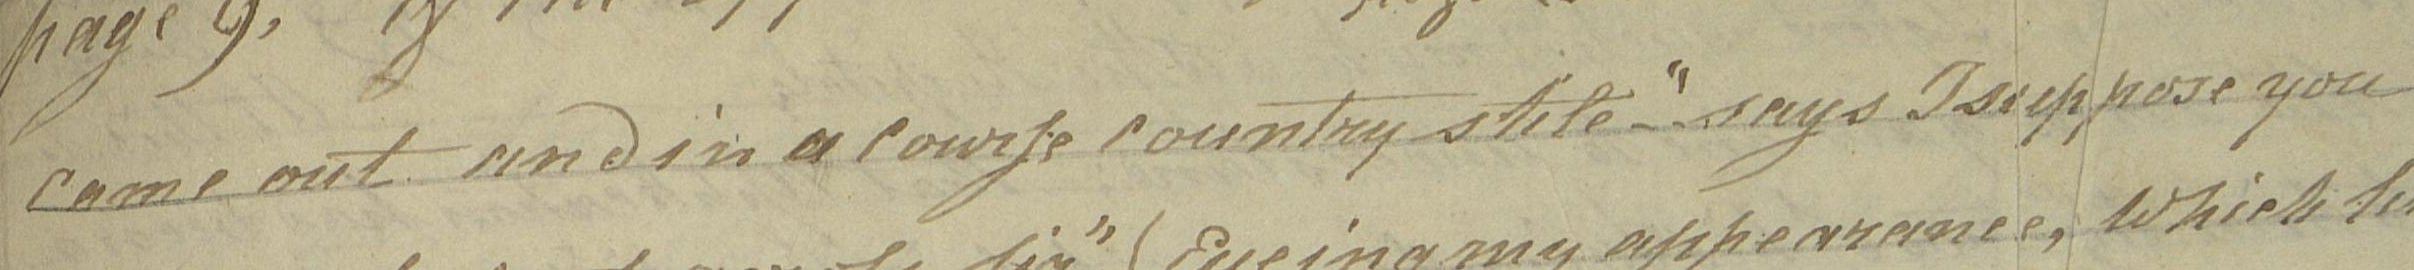came out and in a course country stile "says I suppose you
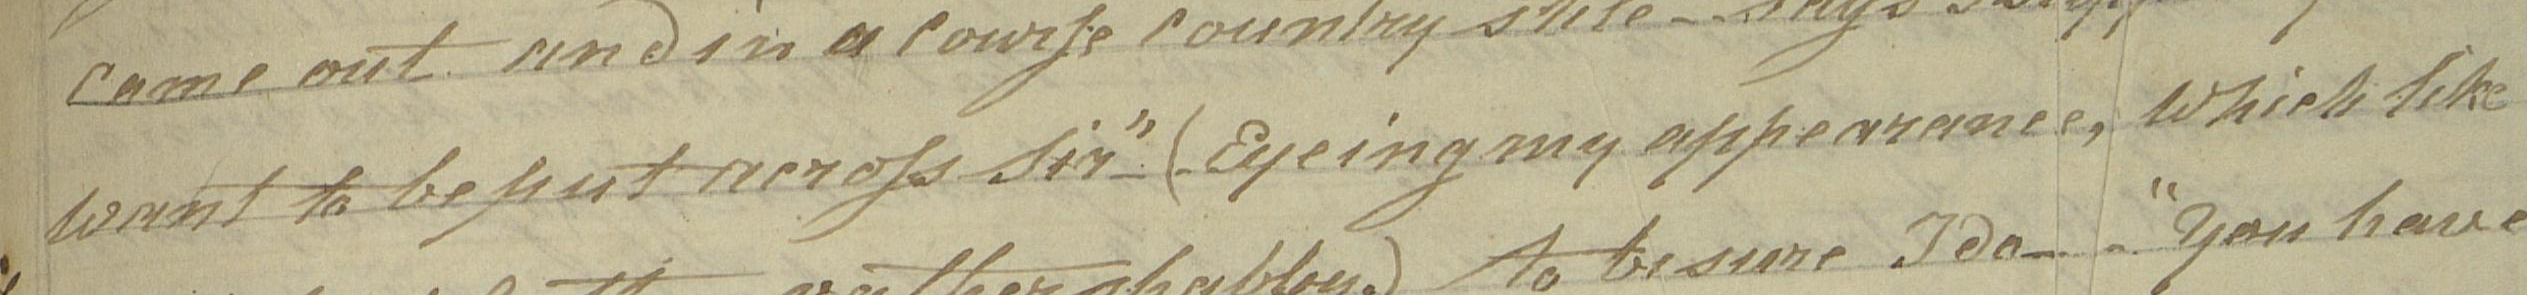want to be put across Sir" (Eyeing my appearance, which like
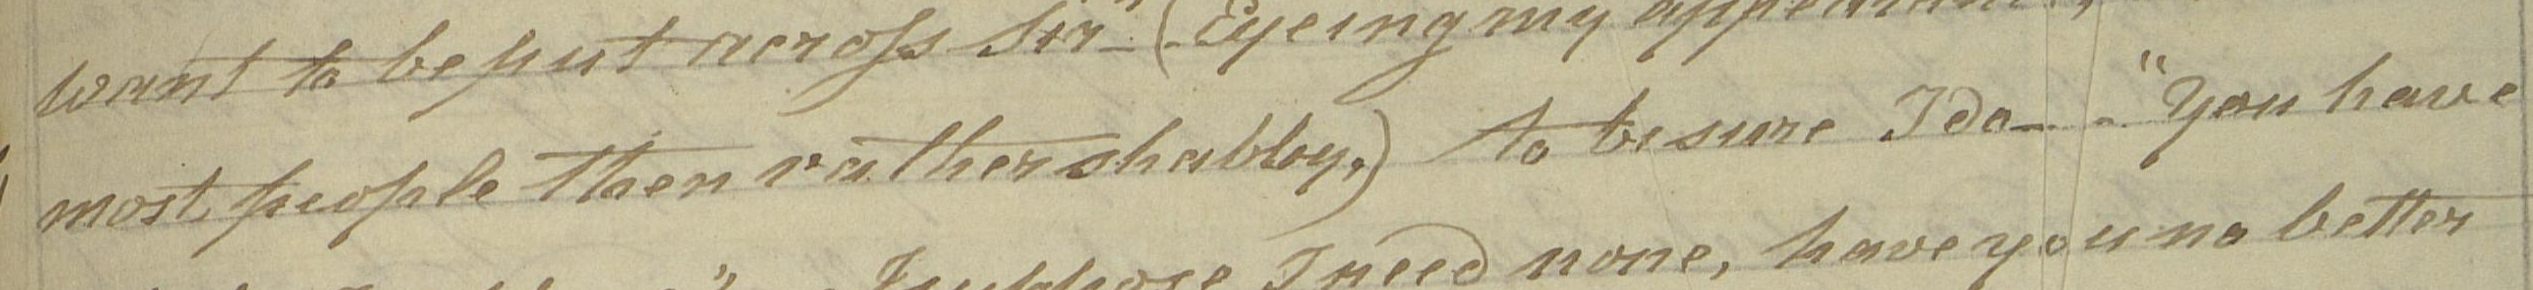most people then rather shabby,) to be sure I do. "You have
